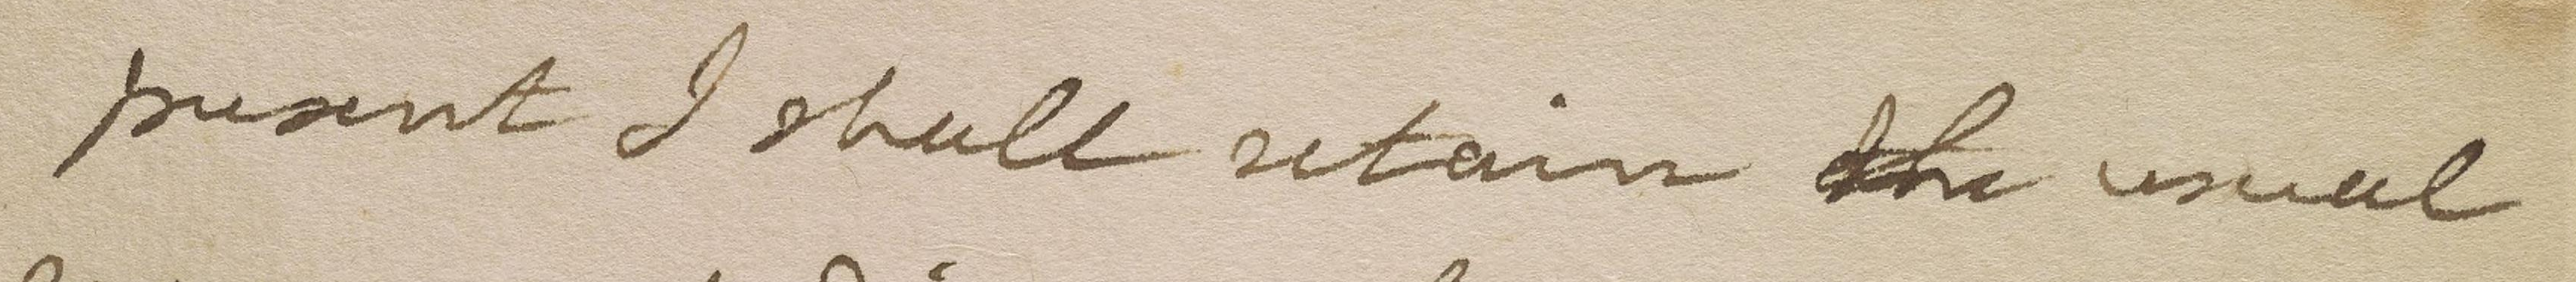present I shall retain the usual
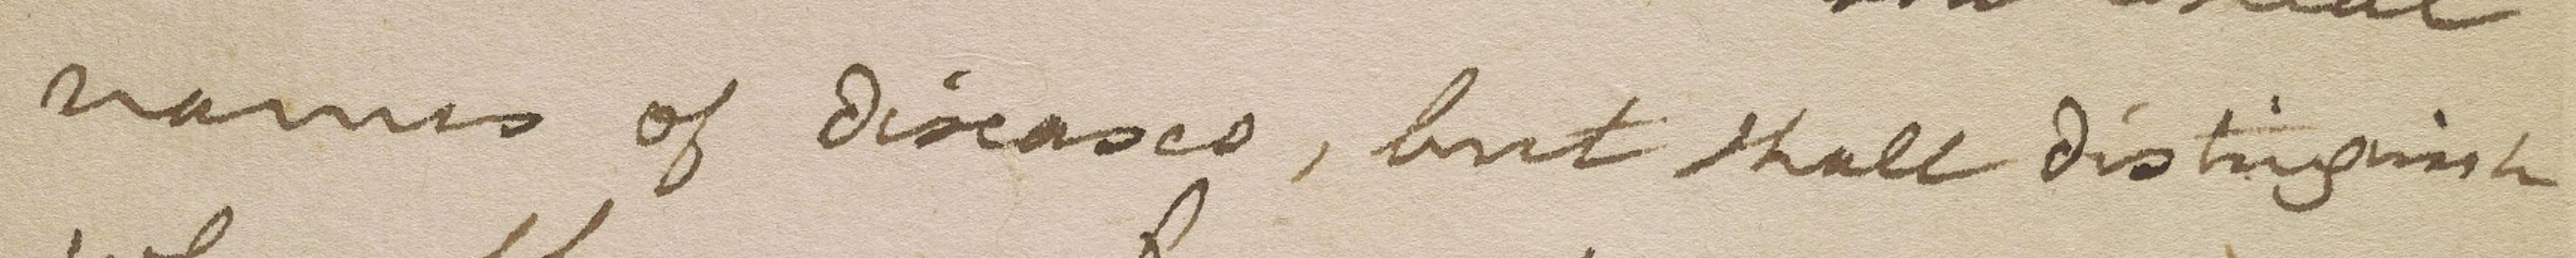names of diseases, but shall distinguish
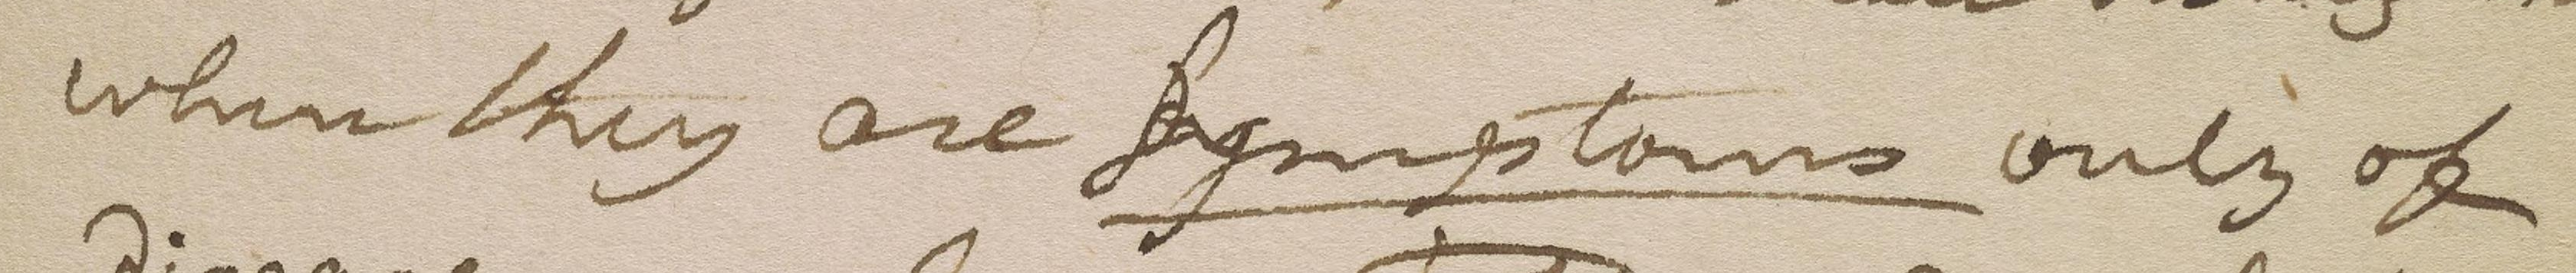when they are Symptoms only of
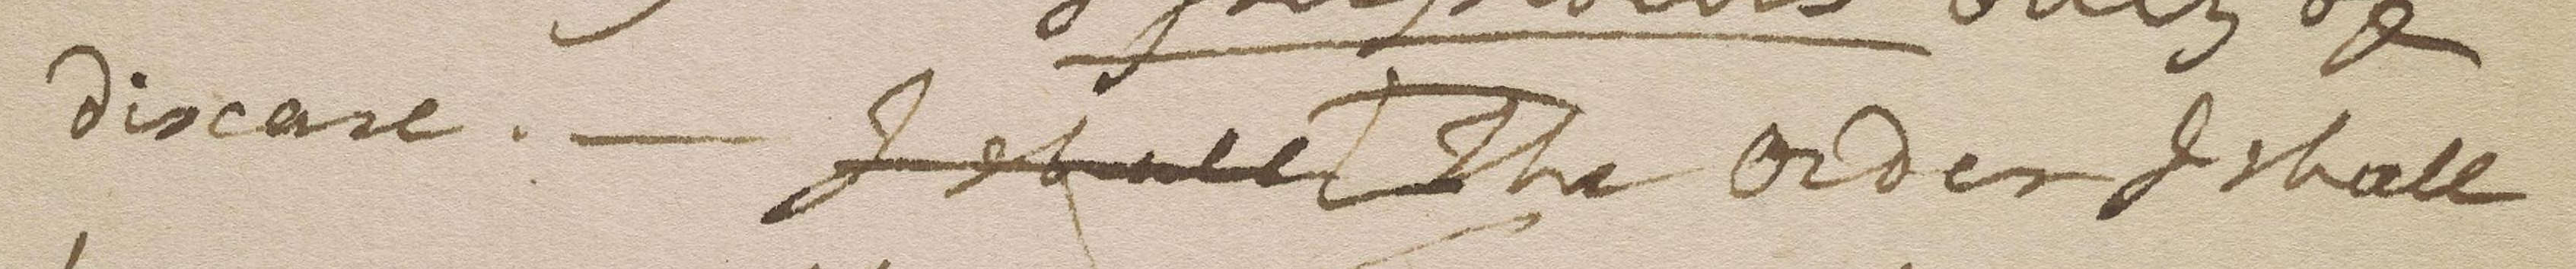disease. [I shall] (The order I shall
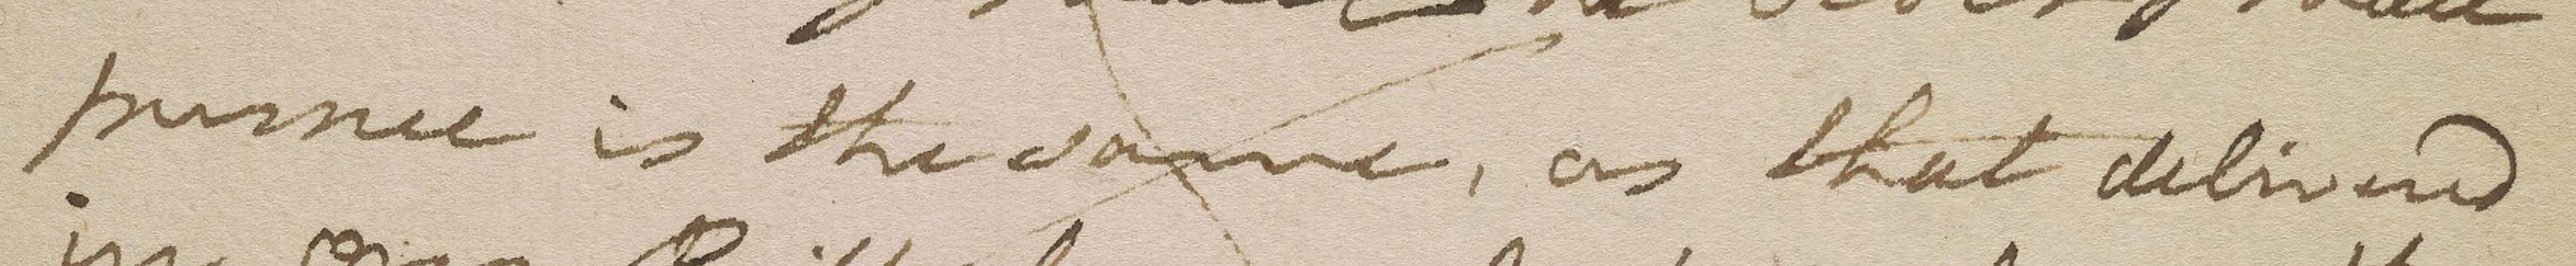pursue is the same, as that defined
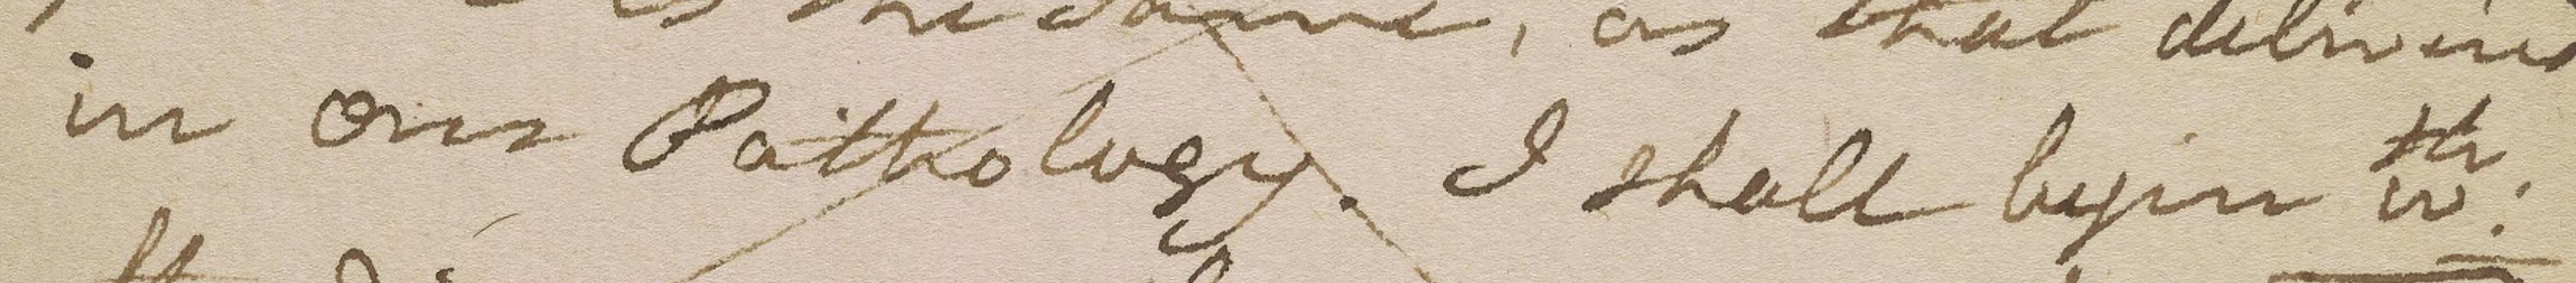in our Pathology. I shall begin w^th:
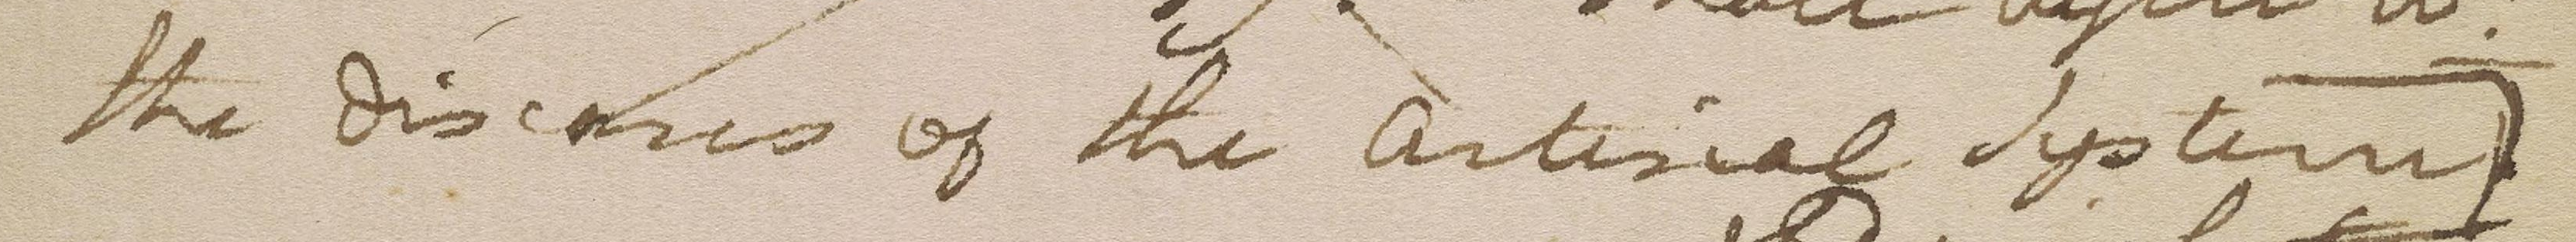the diseases of the arterial system.)
